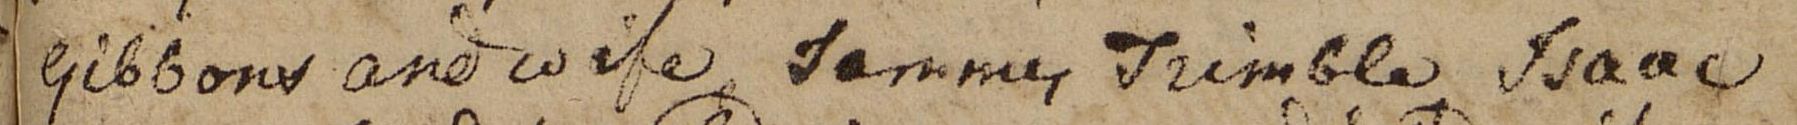Gibbons and wife, Sammy Trimble Isaac
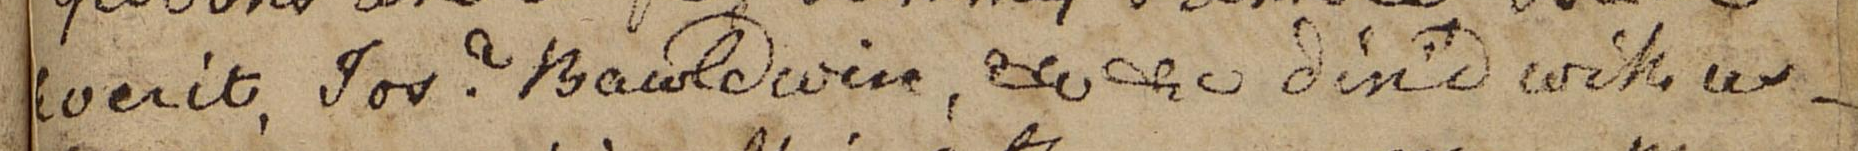Everit, Jos.^a Bawldwin, &c &c din'd with us-
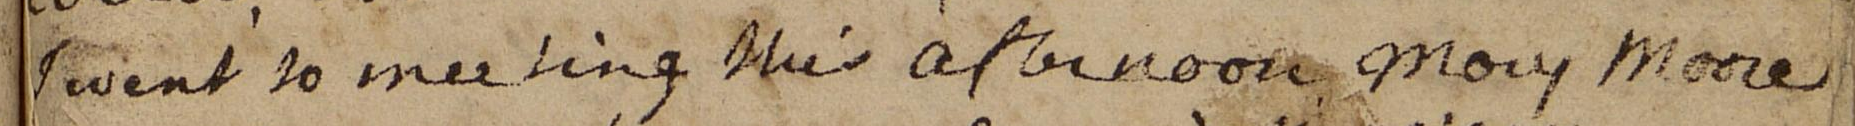I went to meeting this Afternoon Mary Moore
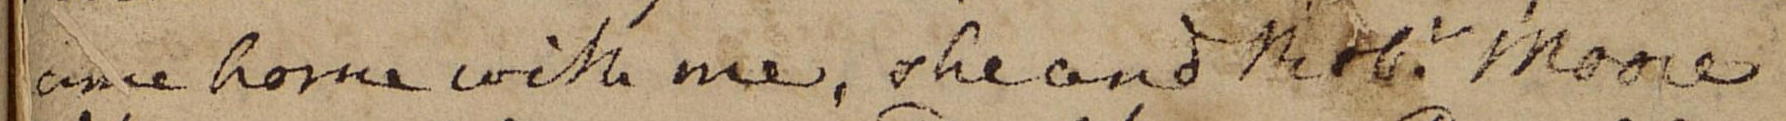ance home with me, she and Rob^t Moore
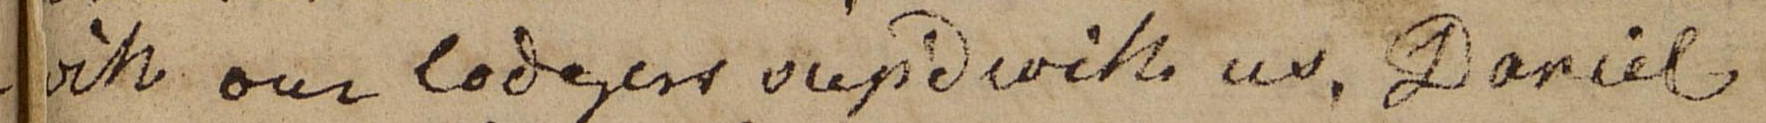ick our lodgers sup'd with us, Daniel
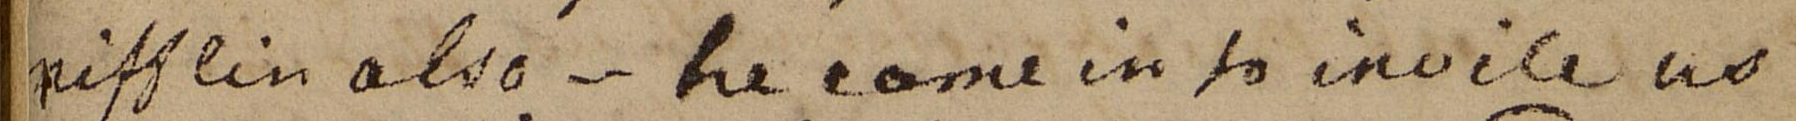Mifflin also- he came in to invite us
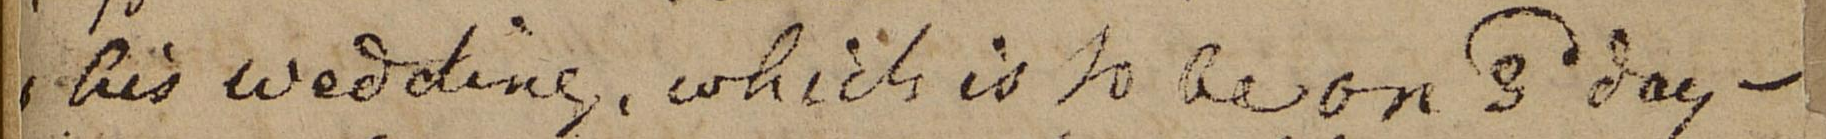his wedding, which is to be on 3^d day-
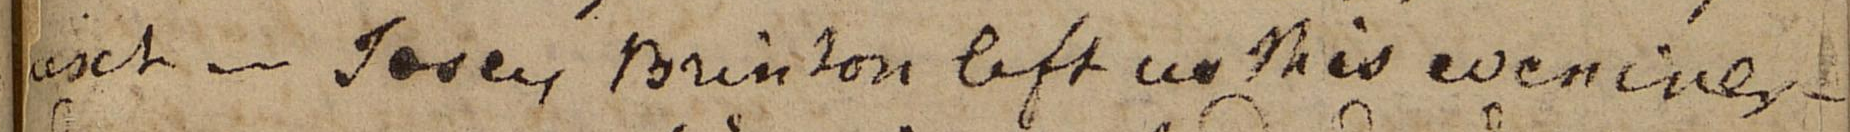usch- Josey Brinton left us this evenine,-
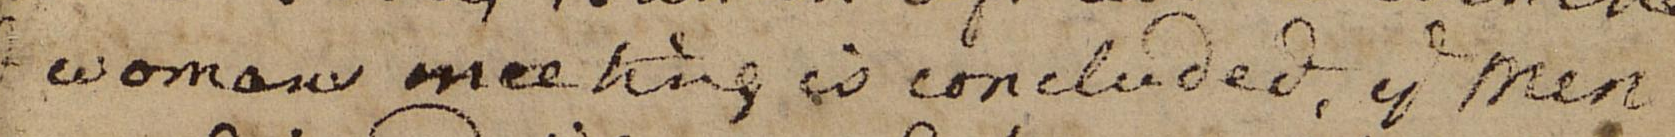womans meeting is concluded, y^e Men
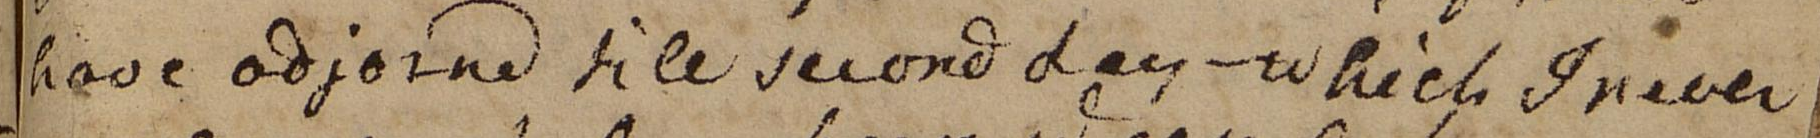have adjoind tile second day- which I never
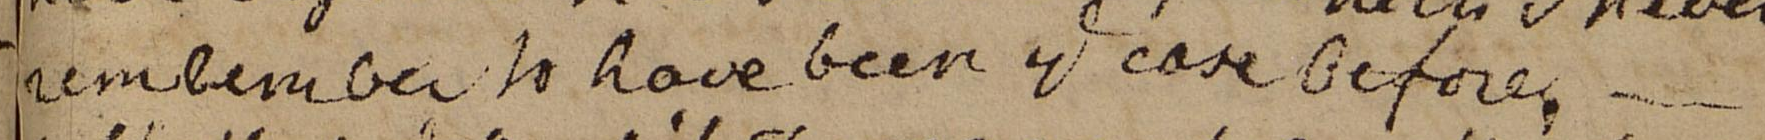rembember to have been y^e case before-
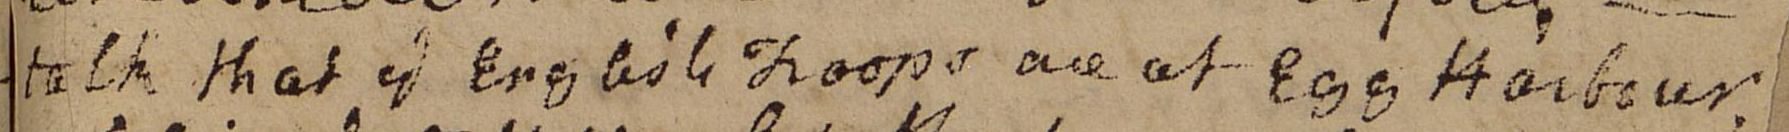talk that y^e English Troops are at Egg Harbour.
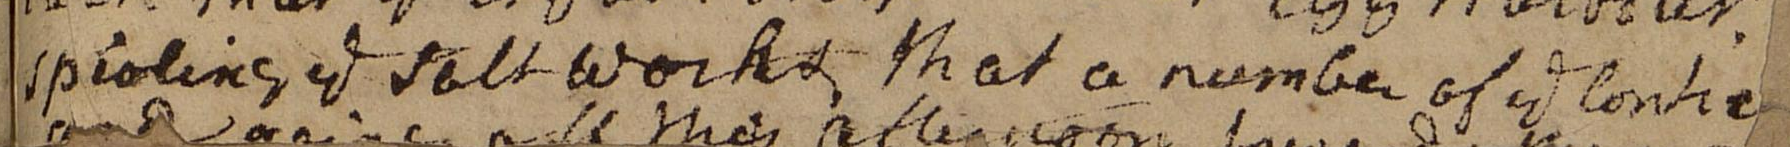spioling y^e salt works, that a number of y^e Contie
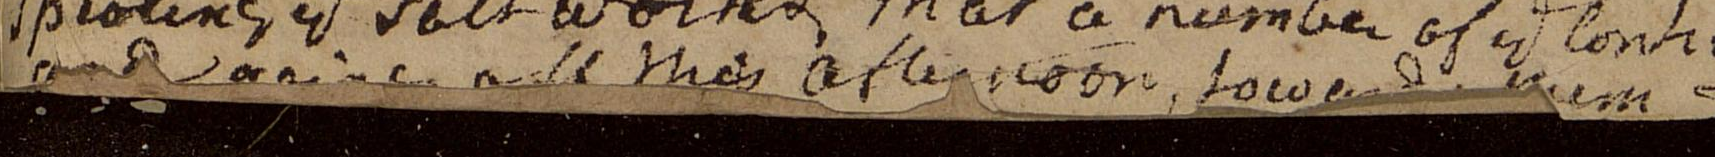and raind all this afternoon, sowed them
